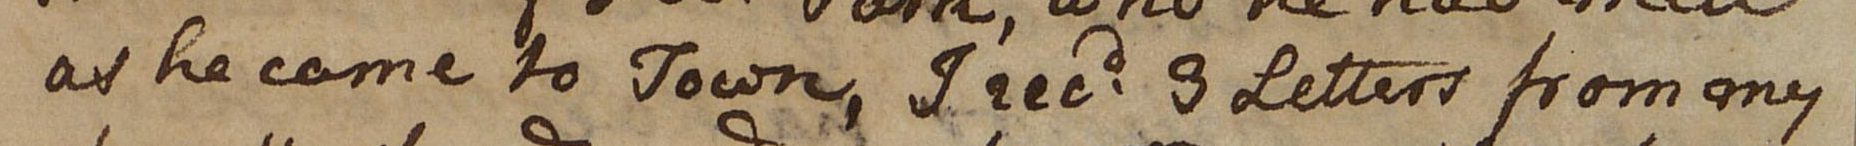as he came to Town, I rec^d. 3 Letters from my
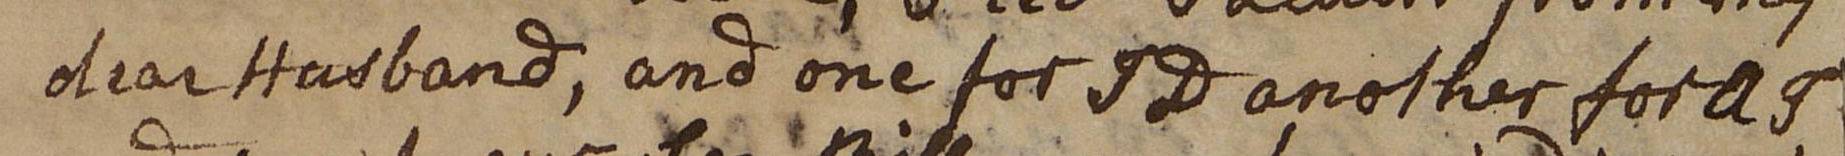dear Husband, and one for JD another for A[T]
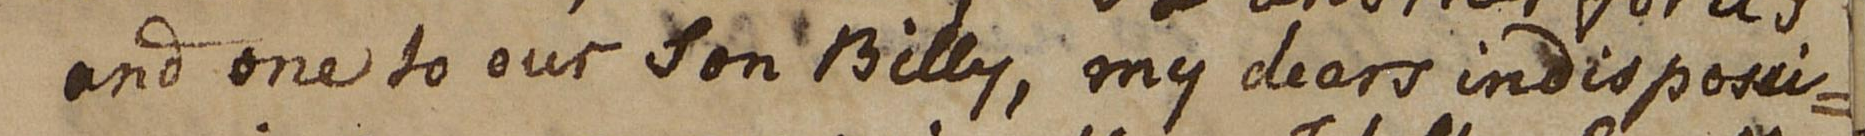and one to our Son Billy, my dears indisposi-
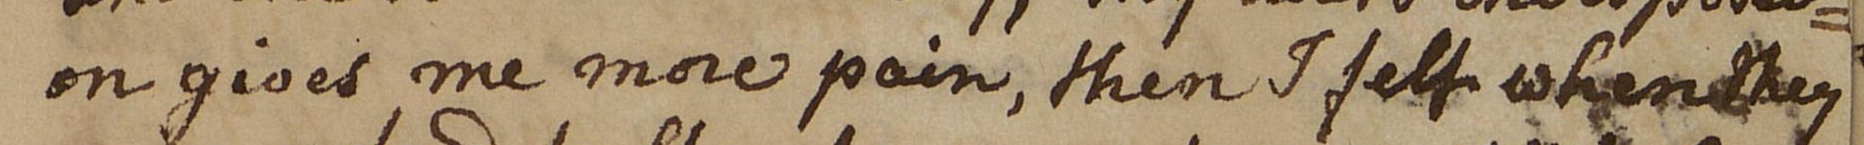on gives me more pain, then I felt when they
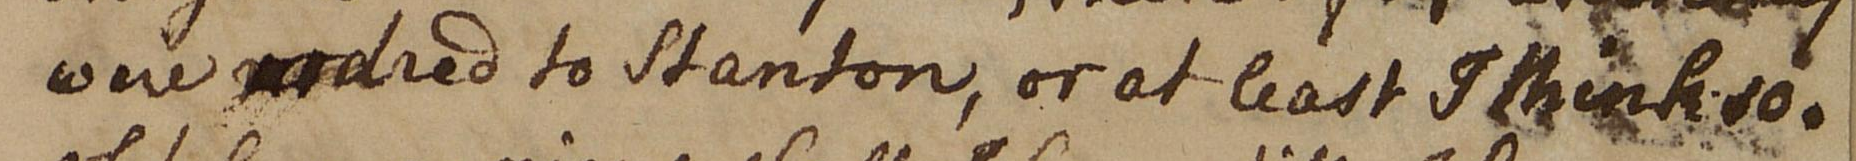were ordred to Stanton, or at least I think so.
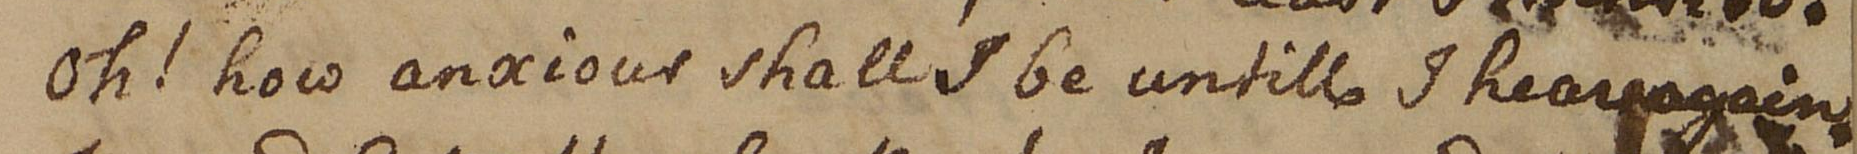Oh! how anxious shall I be untill I hear again
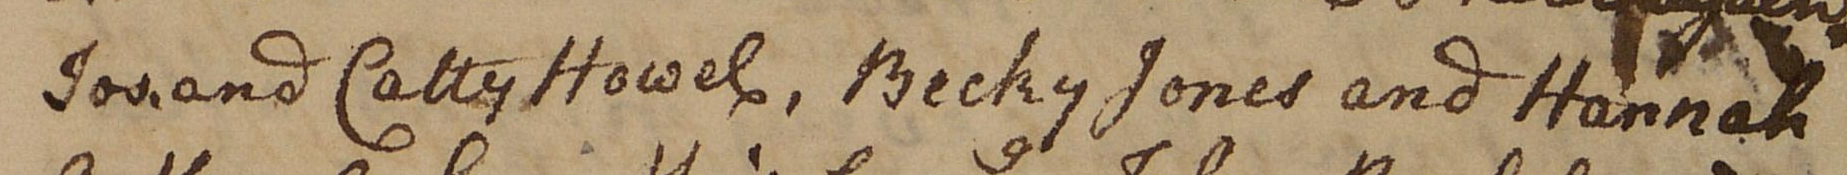Jos. and Catty Howel, Becky Jones and Hannah
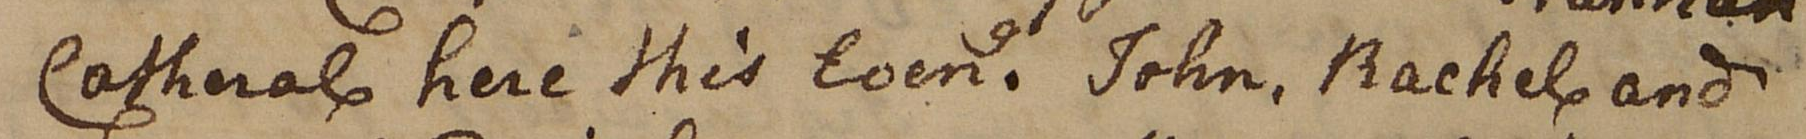Catheral here this Even^g. John, Rachel, and
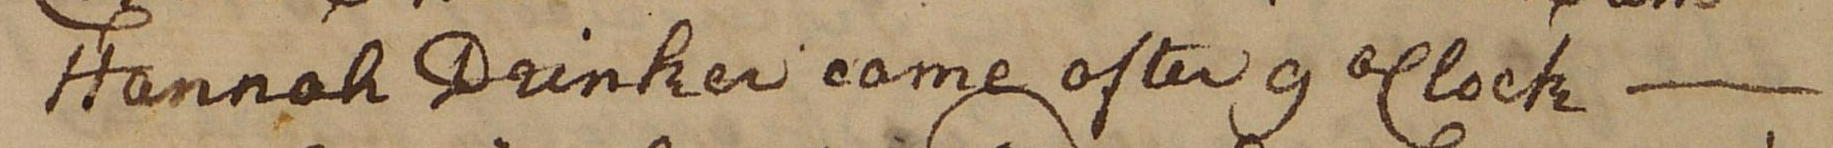Hannah Drinker came after 9 ^o Clock
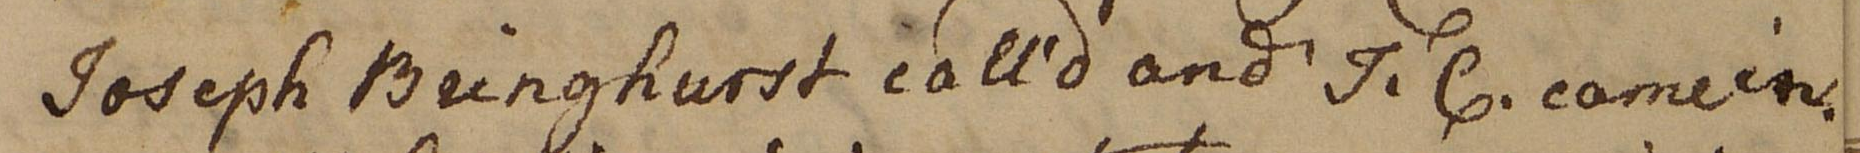Joseph Beinghurt call'd and J.C. came in
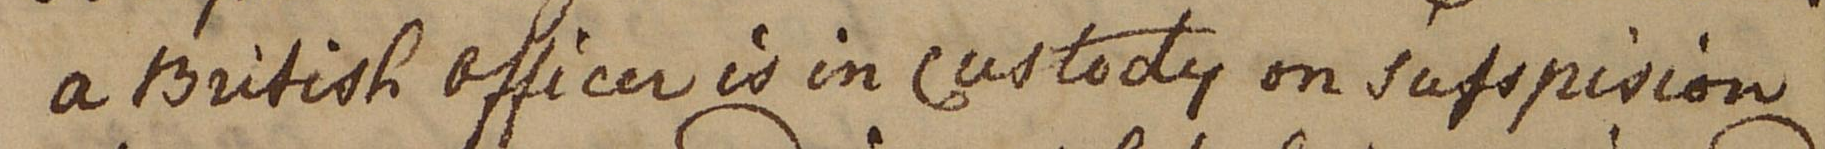a British officer is in custody on susspision
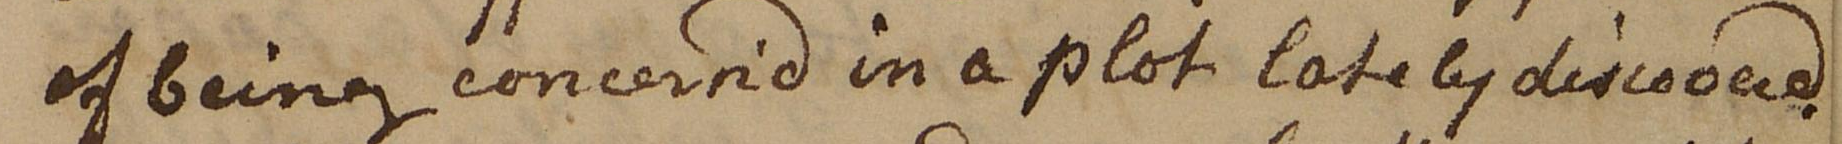of being concerned in a plot late by discoverd
